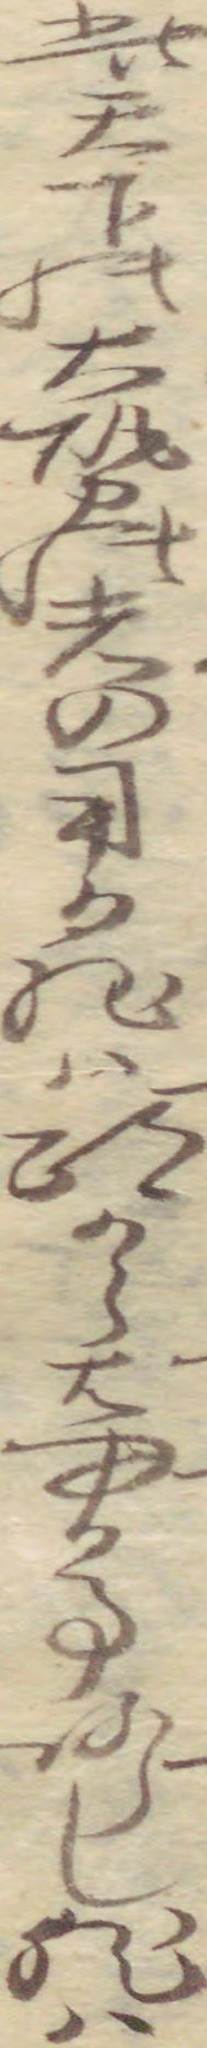此天下の大勢の者の用る程は跡からはゆる事あらし然は
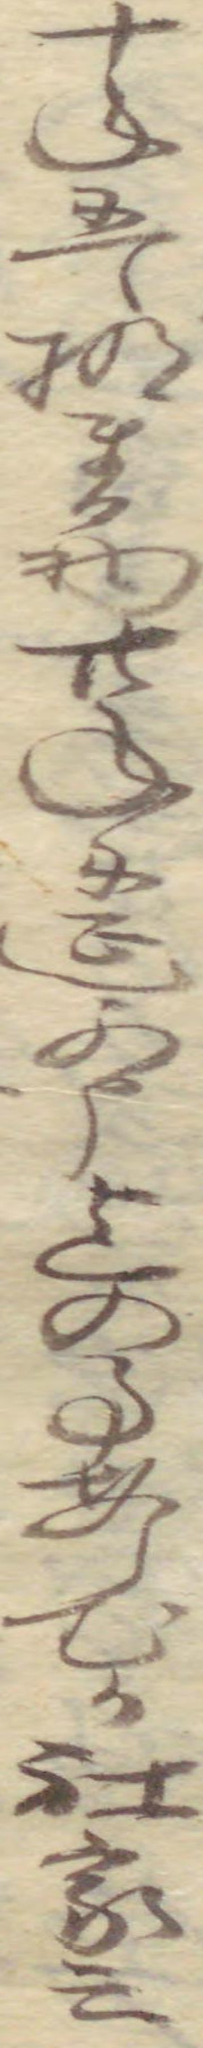十年にて極まる物廿年に延可申迄の事ならむか社家云
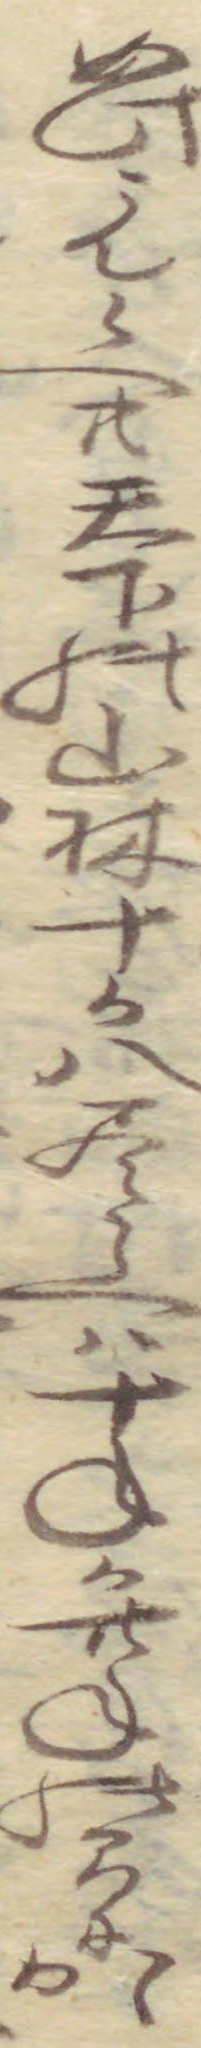如此ニて候へ共天下の山林十か八尽候へは十年か廿年の間にかゝ
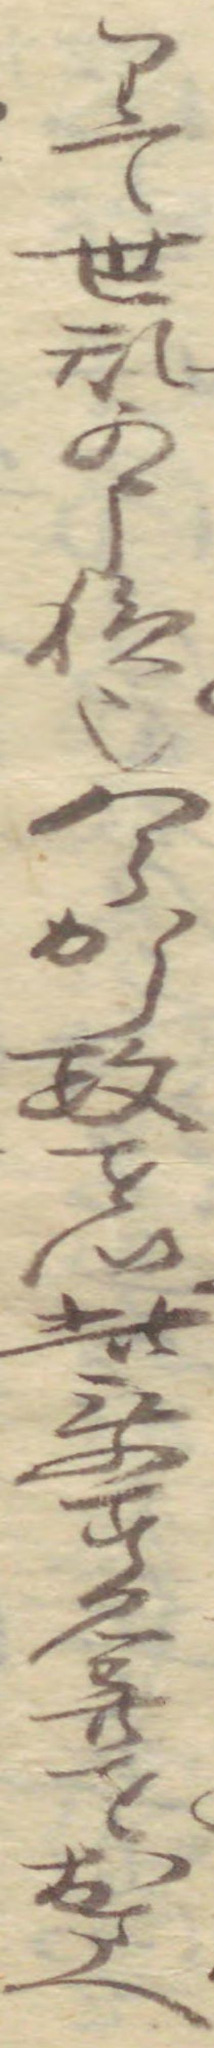りて世乱可申積也今から政を以此乗する算をおさへ
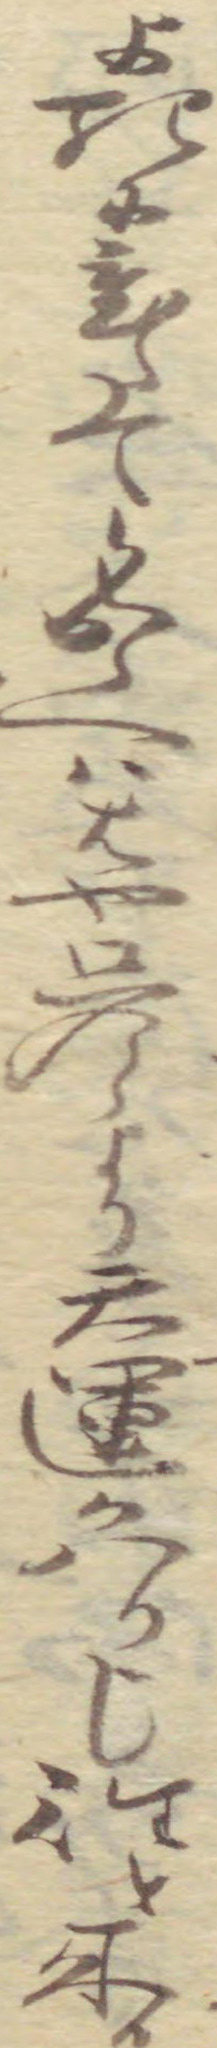よきに置たて被成候へははや只今より天運かはり申候往と来る
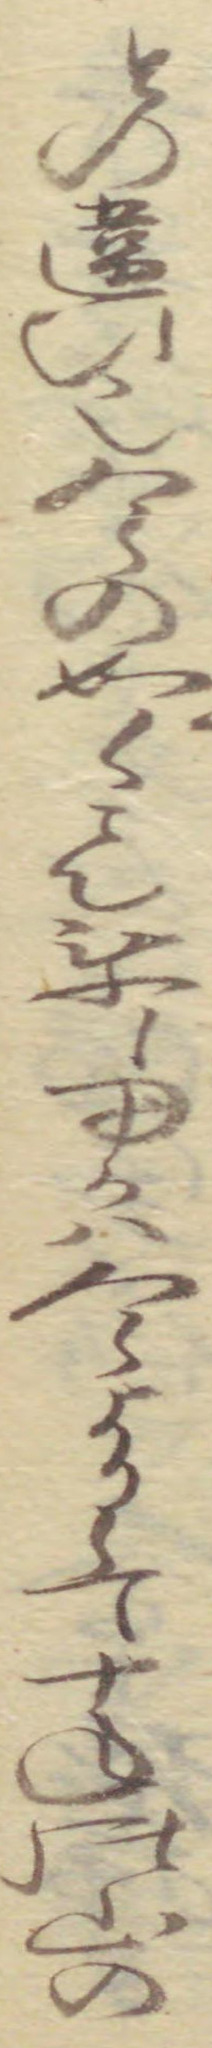との違ひ也今の如くニて乗しゆかは今よりして十年の山の
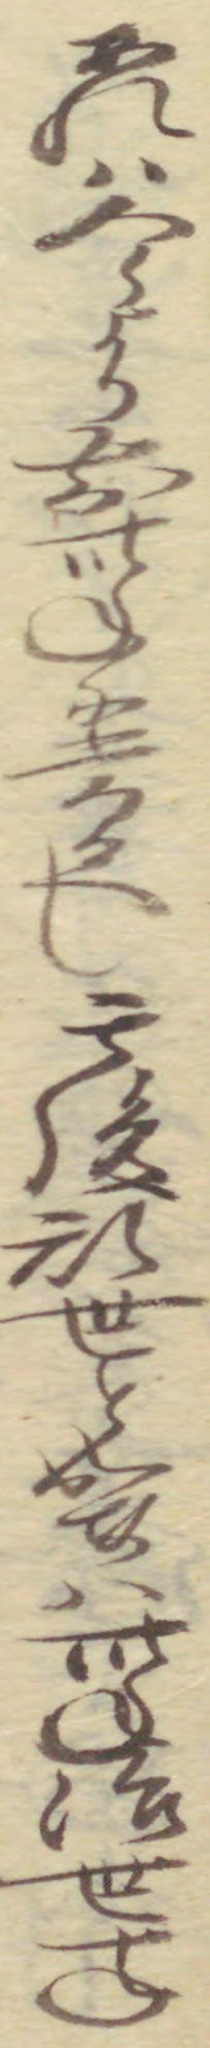あれは今より前卅年に当るへし其後乱世と成なは卅年治世十年
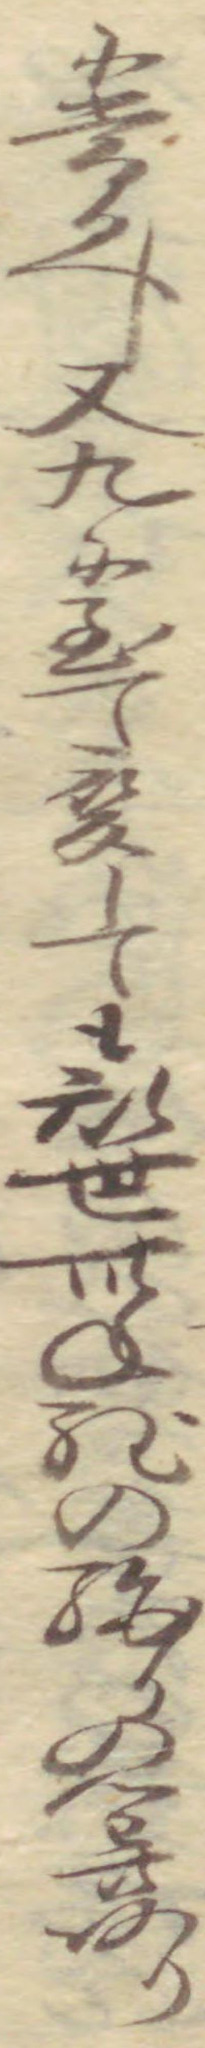に当るへし又九に至て変しても乱世卅年程の残りの算あり
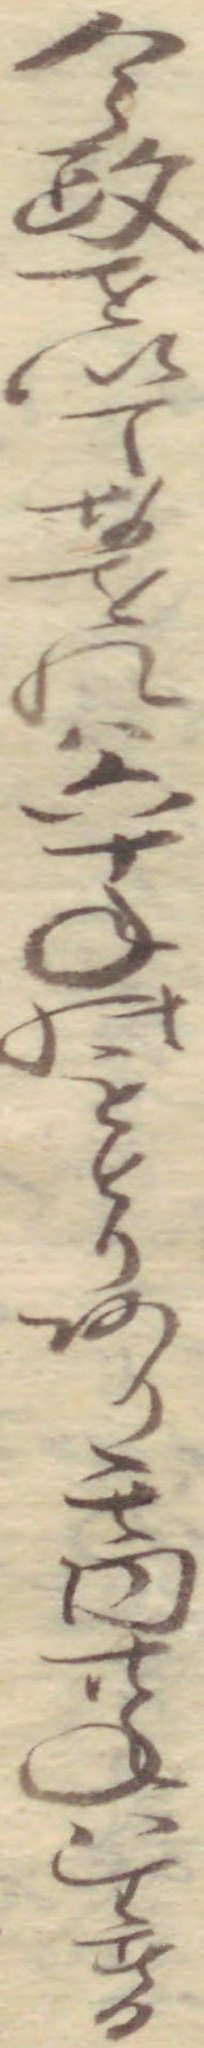今政を以てなをれは六十年のもとりあり其内廿年は生する
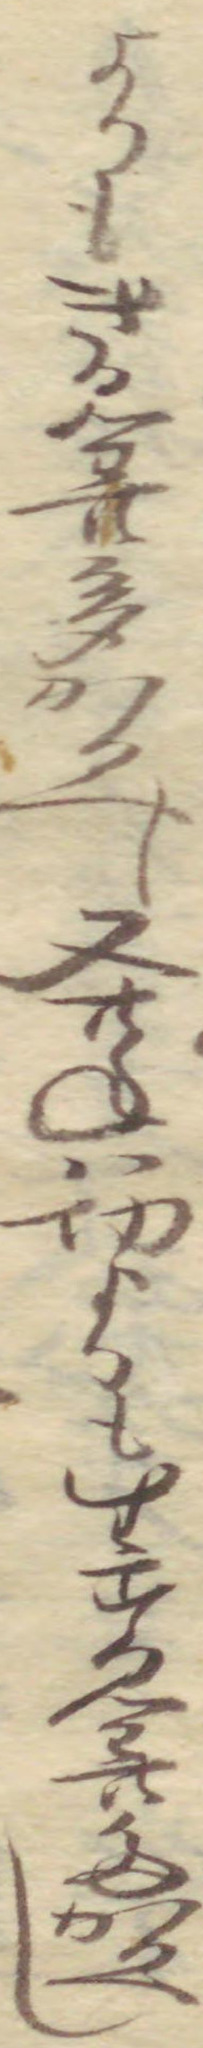よりもきる算多かるへし又廿年は切よりも生する算多かるへし
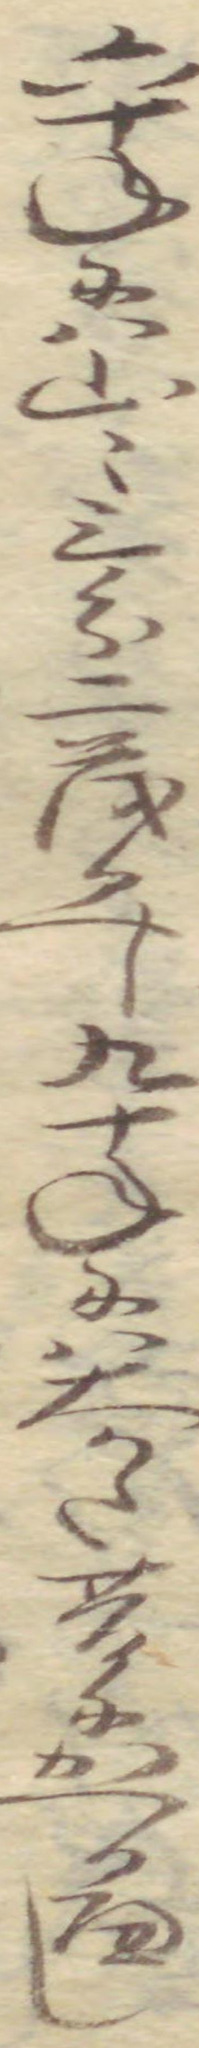六十年には山〻三分二茂るへし九十年には大かた昔にかへるへし
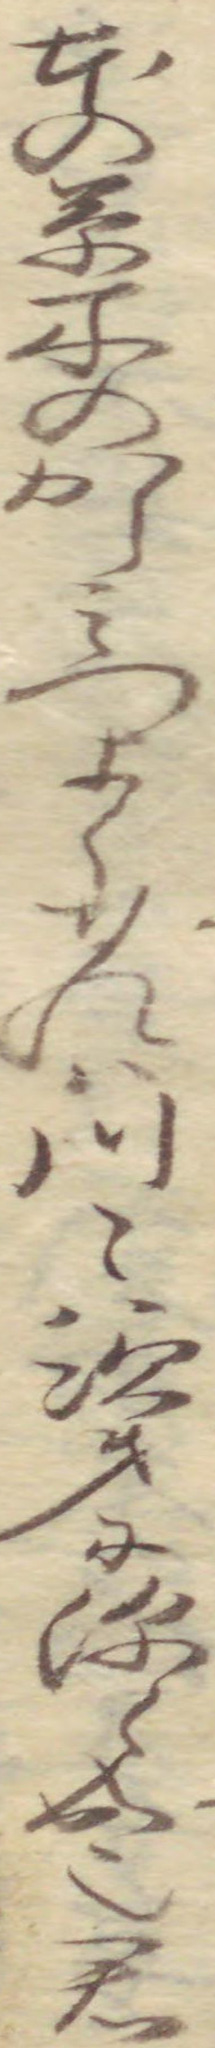本の草木のからみつよくなれは川〻次第に深く成也君
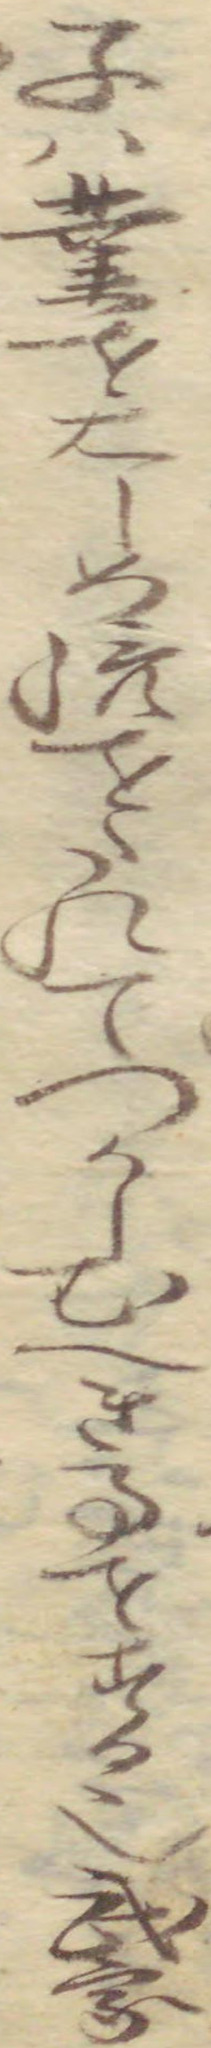子は業をはしめ統をたれてつかしむへき事をする也武家
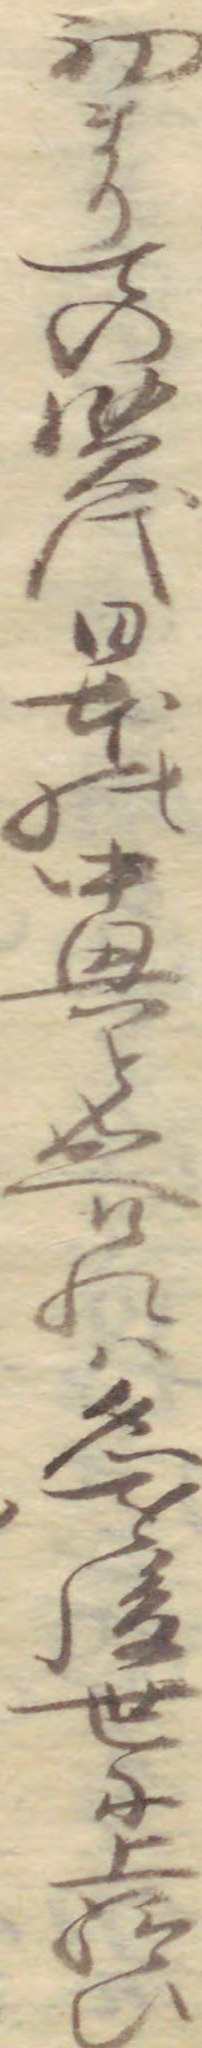初まりての賢代日本の中興と成へけれは名を後世に上給ひ
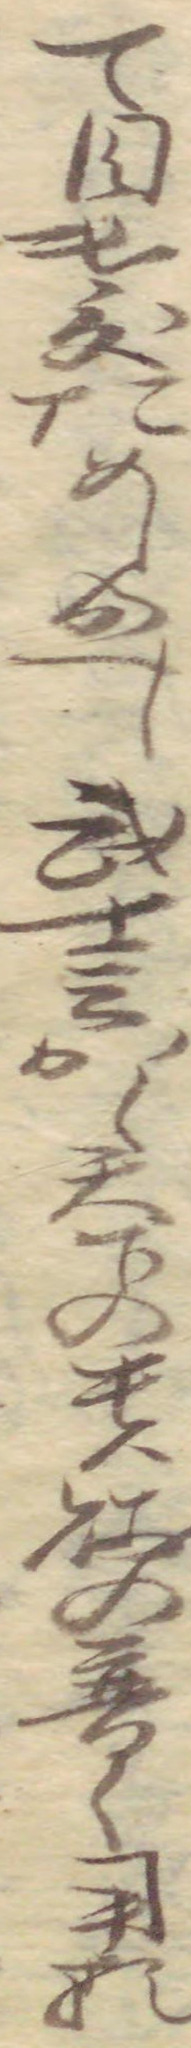て目出度ためし成へし武士云かく天下の貴賎の普く用る
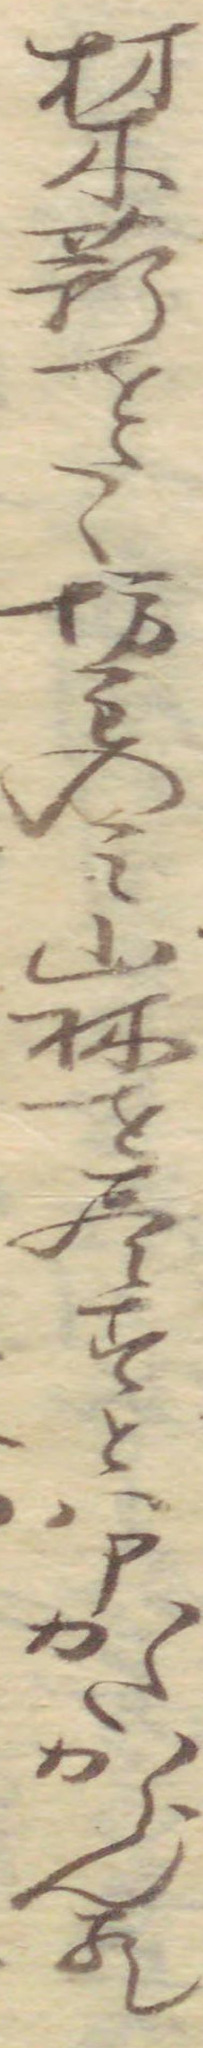材木薪をたゝ坊主のみ山林を尽すとは申かたからん歟
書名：鶯宿雑記. 巻263-264
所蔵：国立国会図書館 National Diet Library, JAPAN
